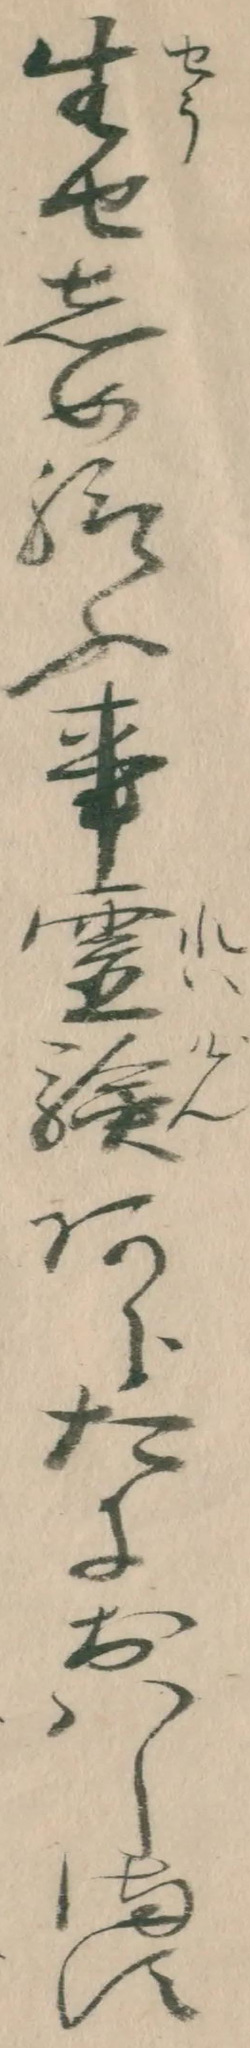生せしめ給ふ事霊験あらたにおはします
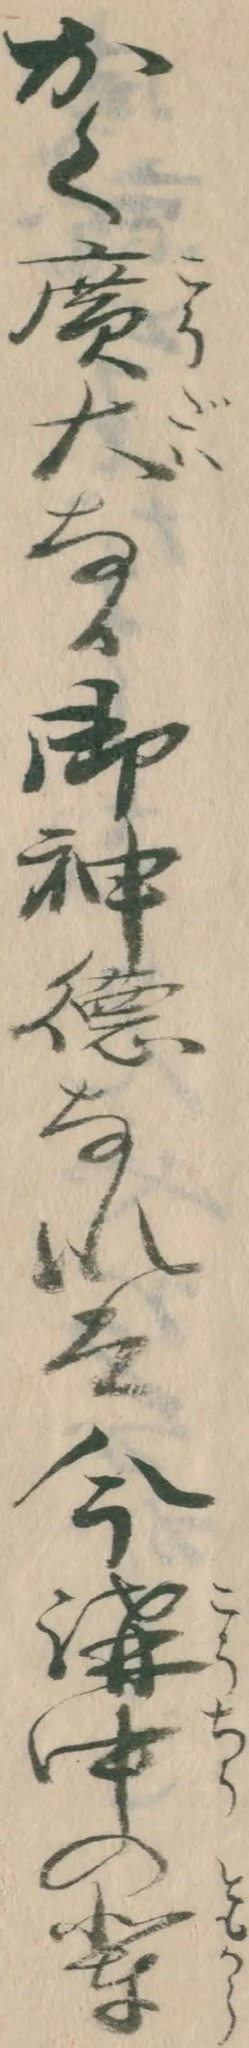かく広大なる御神徳なれは今講中の輩
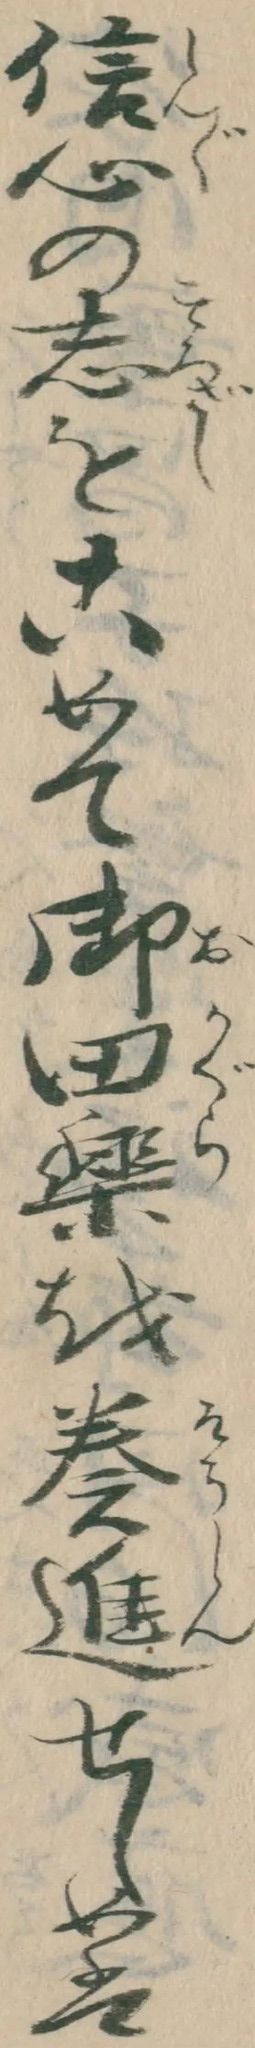信心の志をこめて御田楽を奏進せしめは

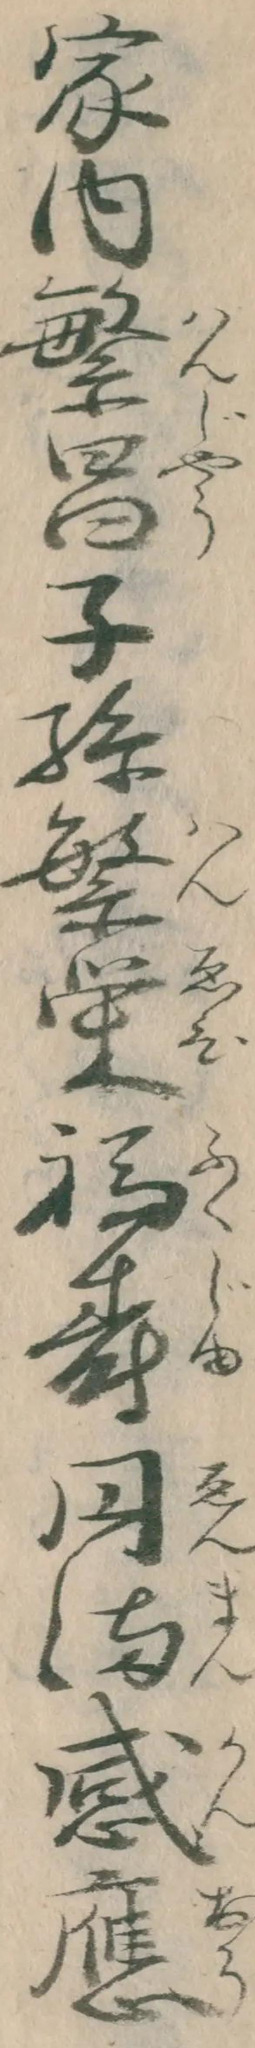家内繁昌子孫繁栄福寿月満感応
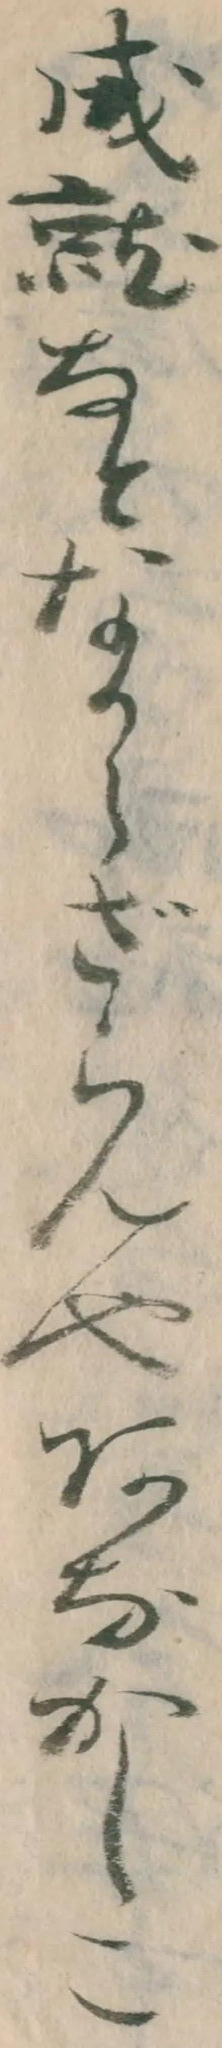成就なとなからざらんやあなかしこ
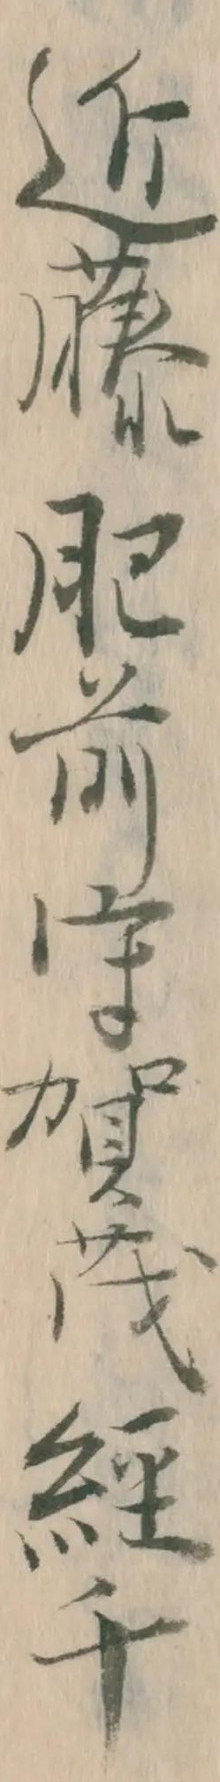近藤肥前守賀茂経千
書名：賀茂社記録. 第8冊
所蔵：国立国会図書館 National Diet Library, JAPAN
